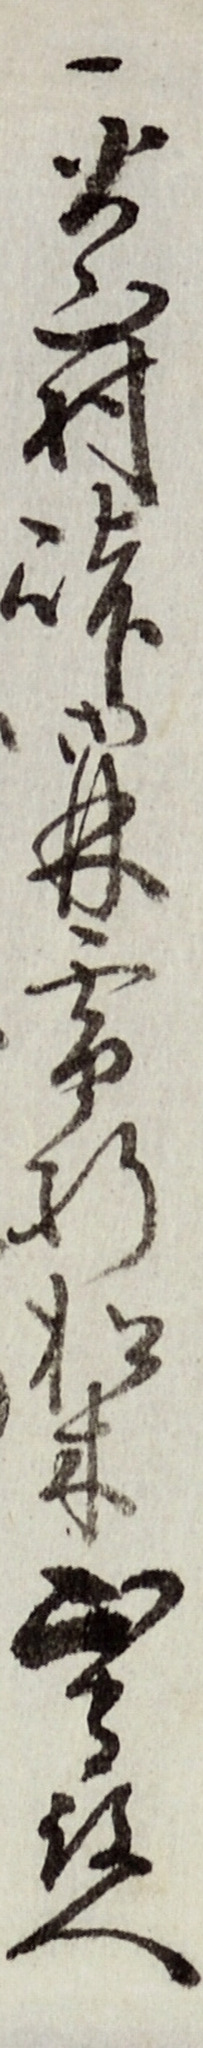一火山村峠御林雪折松木山守役人
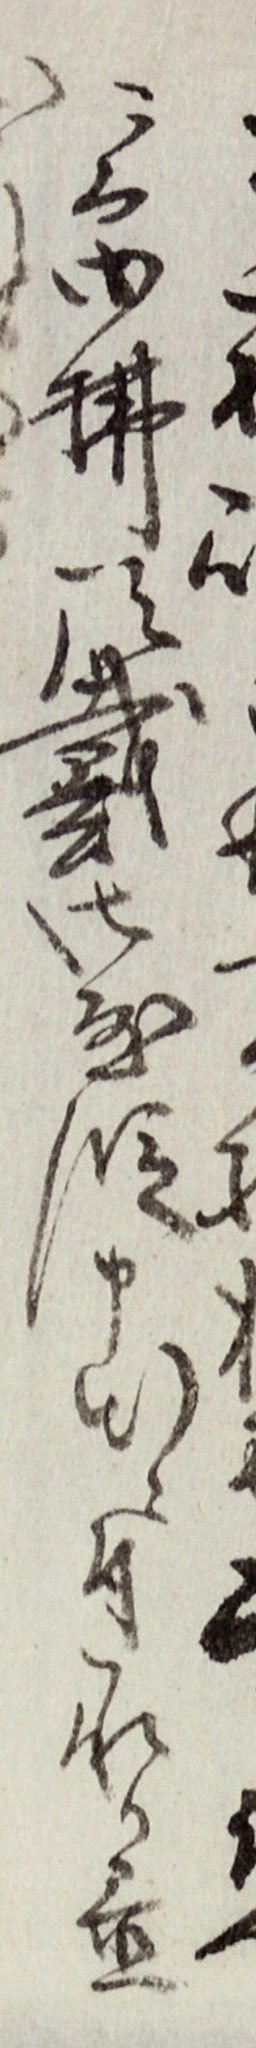ニ而御払頂戴仕度段申出ニ付承り置
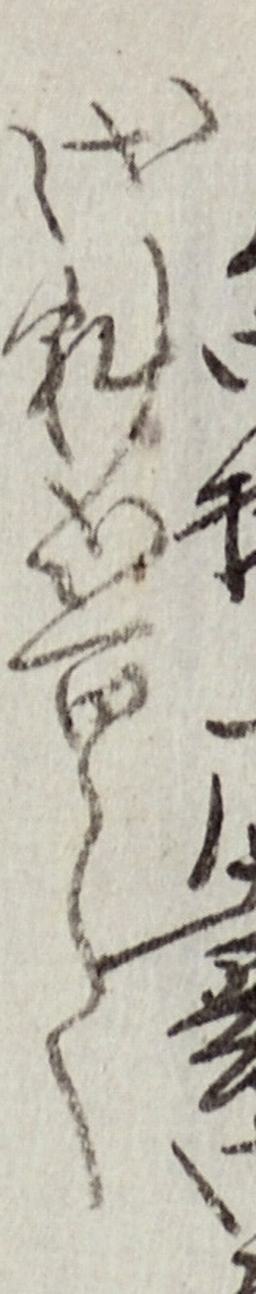代料弐百匁
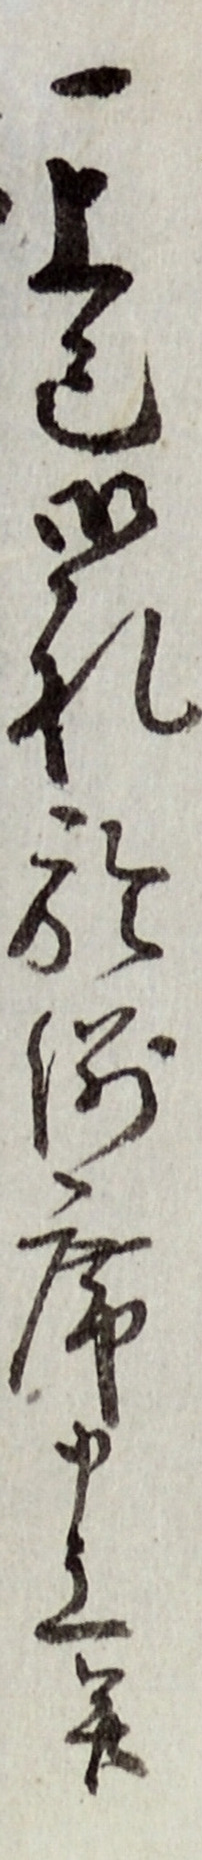一上巳御礼於例席申上并
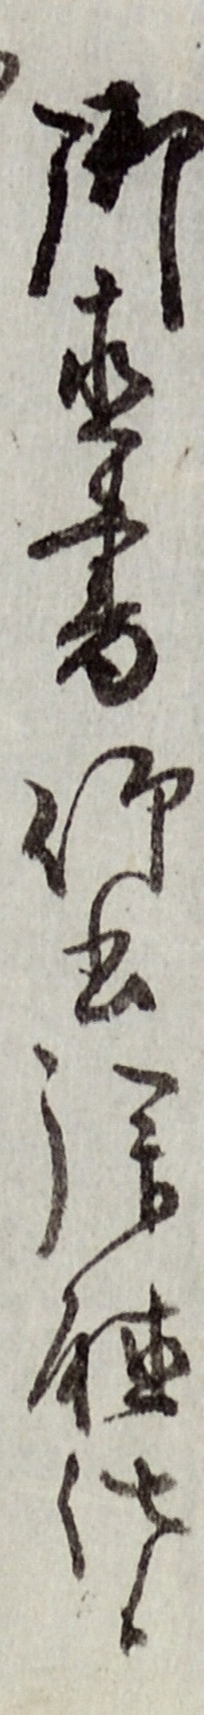御直書仰書拝聴仕候

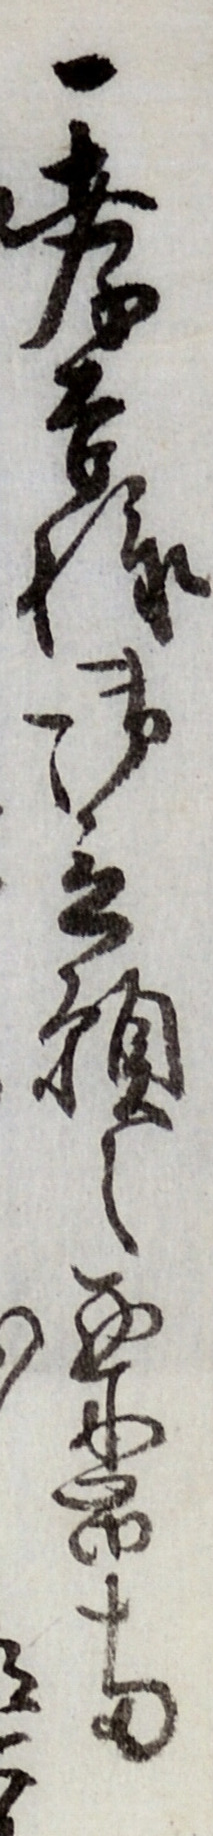一孝吉様御立願之栗苗両
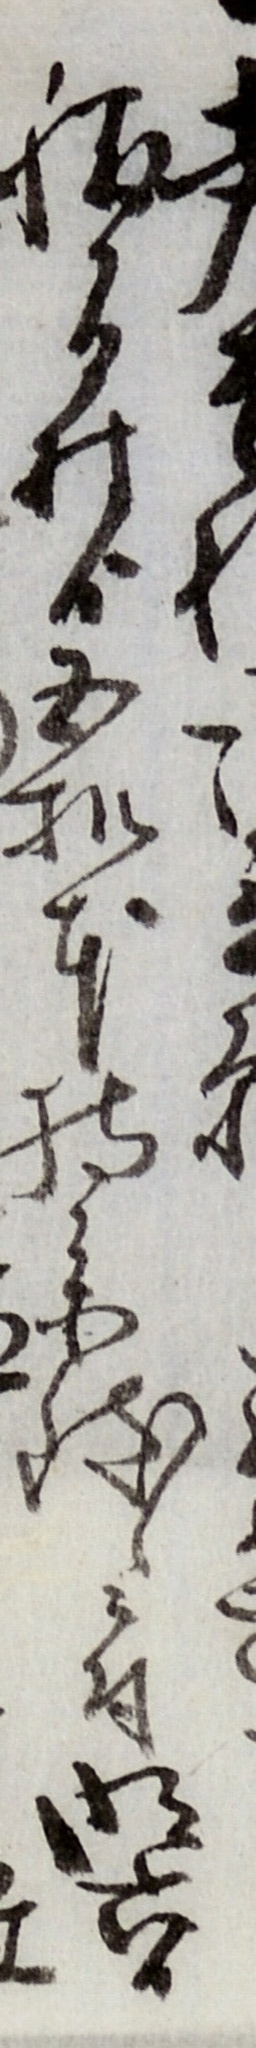勝間村ゟ五拾本持参致候ニ付明六日
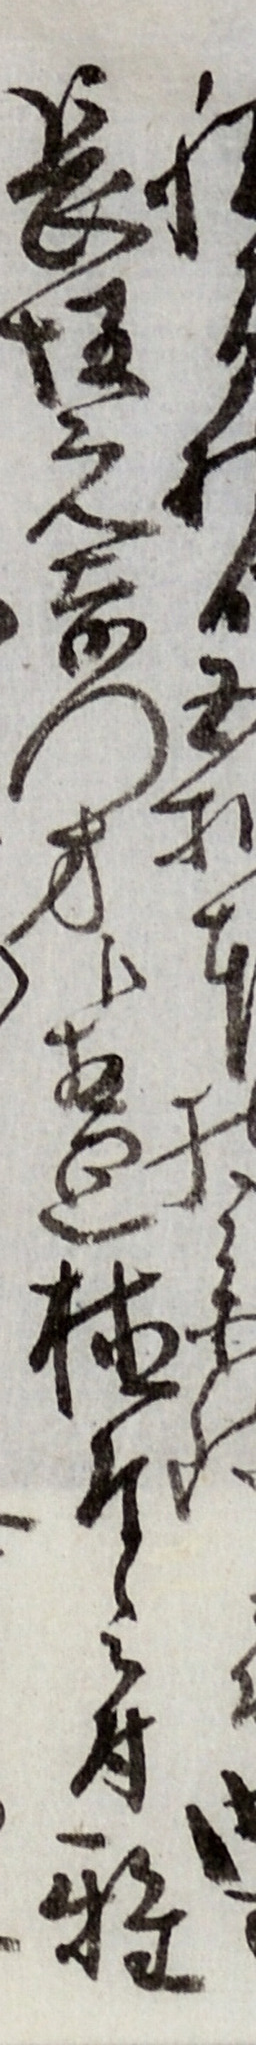長坂元右衛門方江相廻植付候ニ付雅
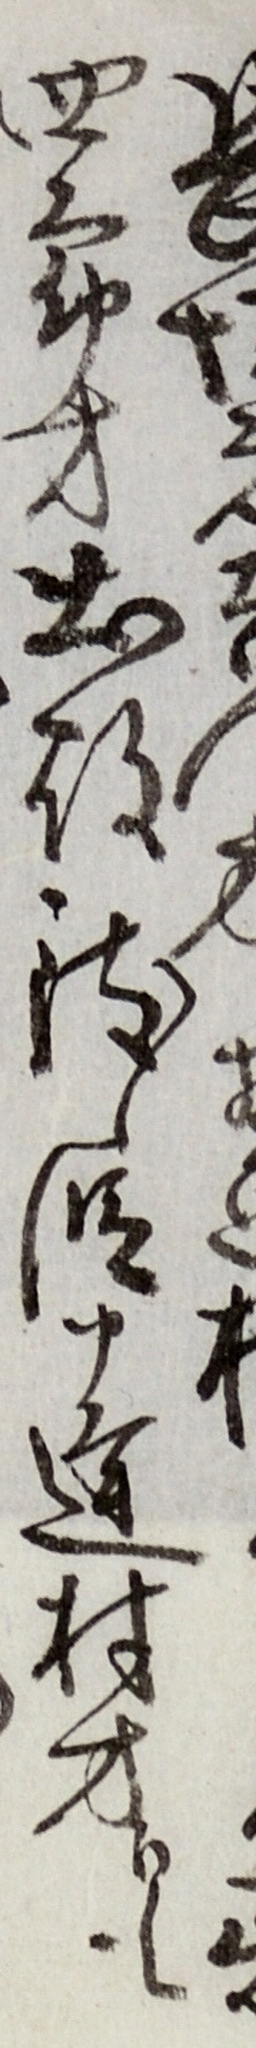四郎方出役致候段申達村方江も
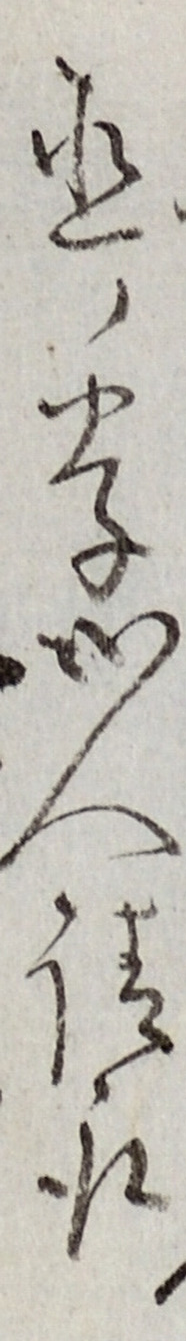直ノ弐人請取
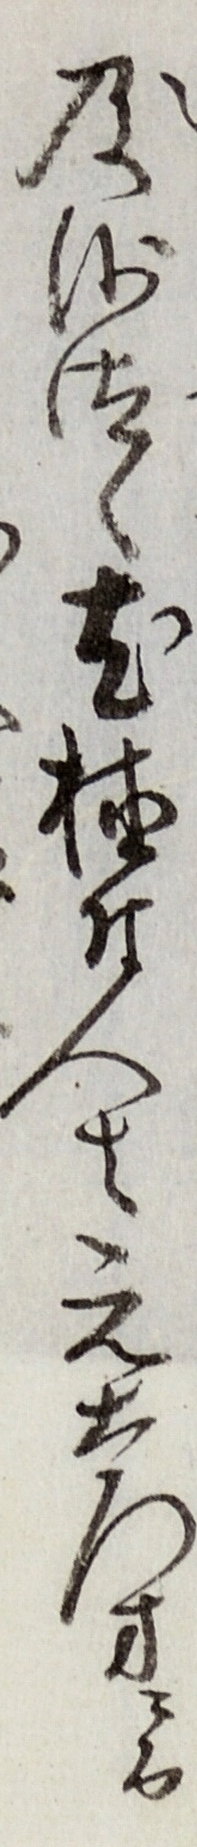及沙汰候尤植付人者元右衛門方ニ而
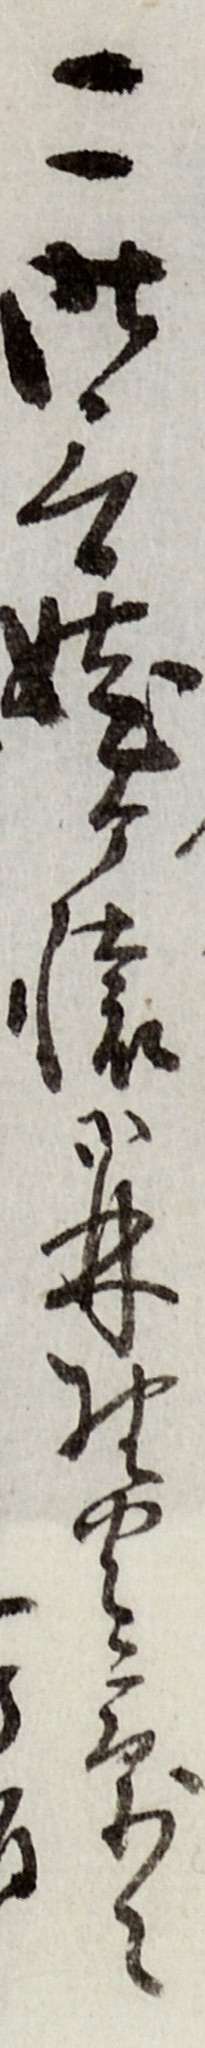一一昨三日姥ケ猿御林野火ニ而少々
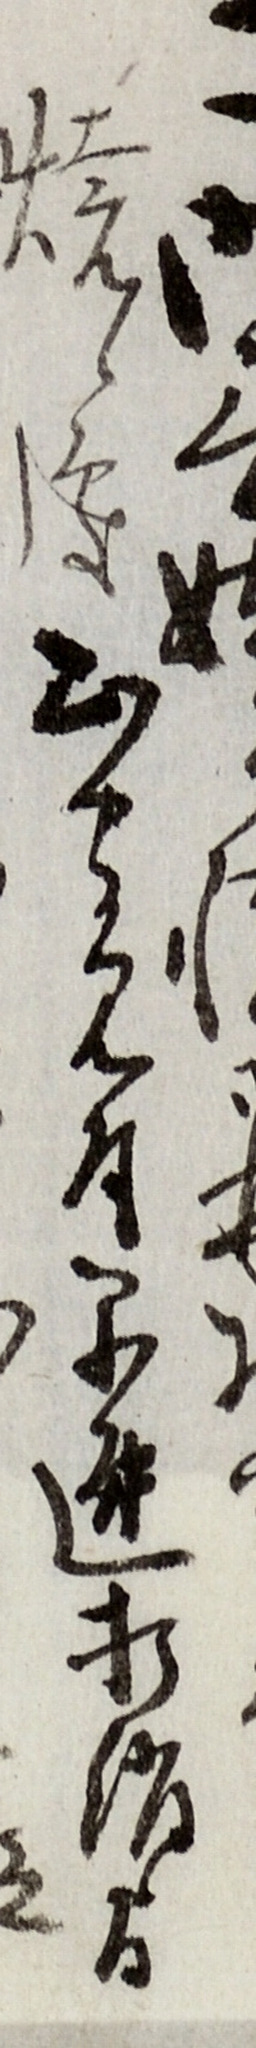焼候処山守見付早速打消候間
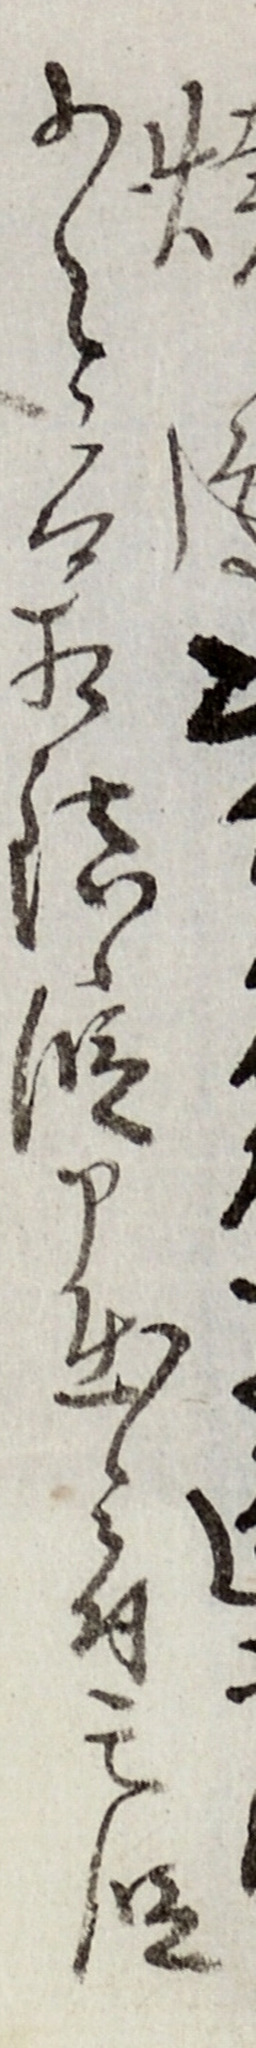少々ニ而相鎮候段申出候ニ付其段
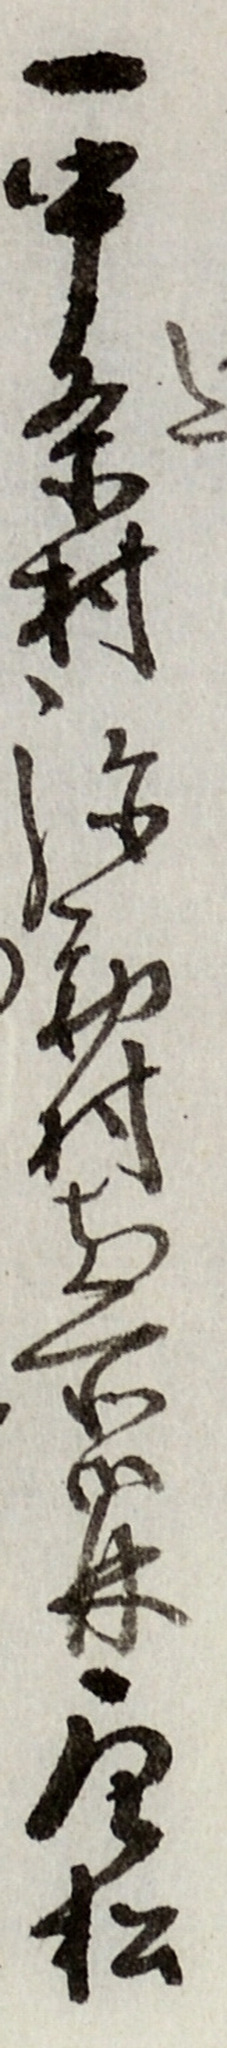一中条村弥勒村両所御林唐松
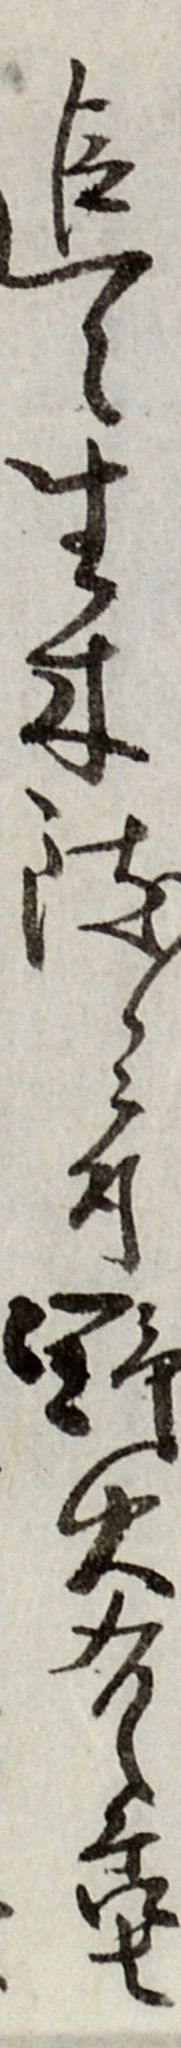追々生木致候ニ付野火有之節者
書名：御山方御薪方諸事御用留
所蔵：伊那市立高遠町図書館・合同会社AMANE
